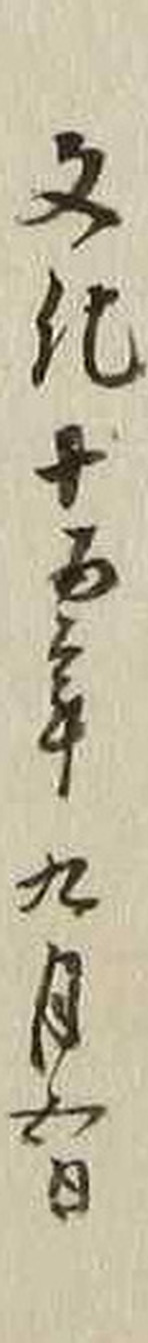文化十酉年九月五日
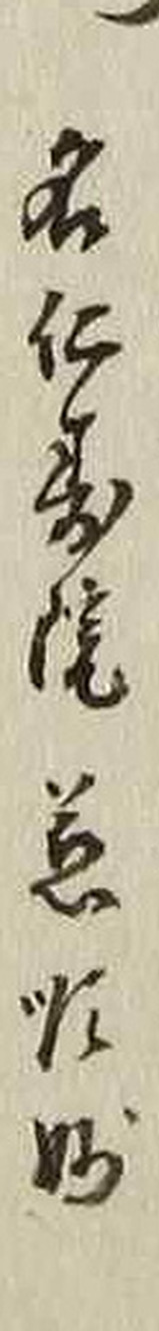名仁寿院恙順妙
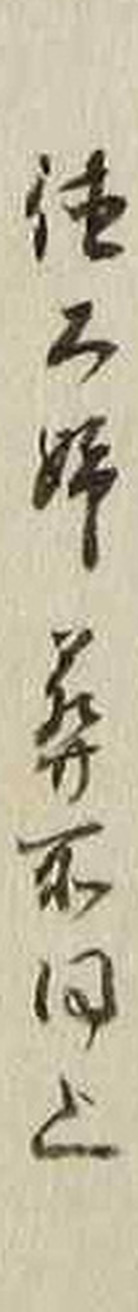徳大姉葬所同上
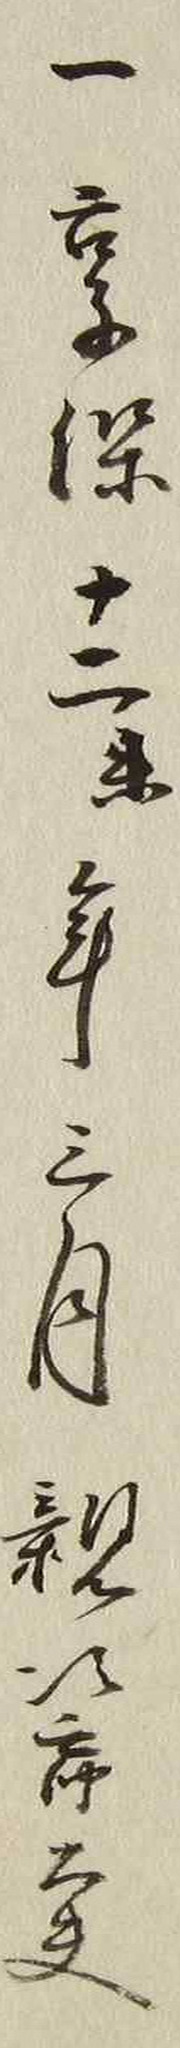一享保十二未年三月親次郎太夫
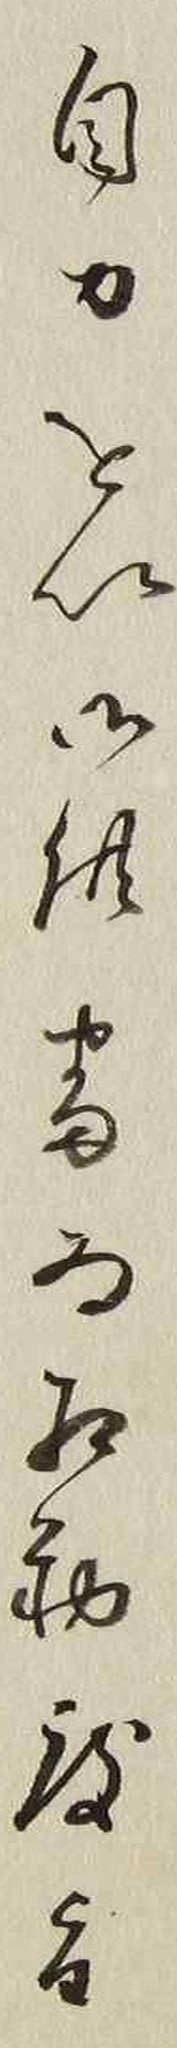自力を以御供番為相勤度旨
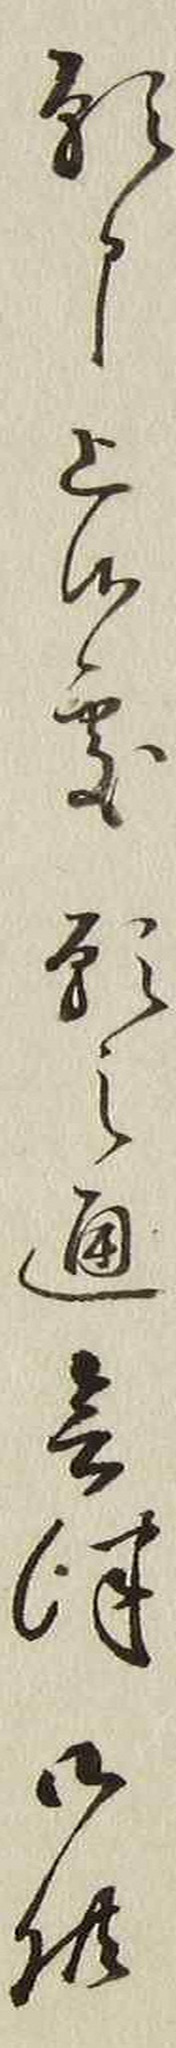願申上候処願之通会津御供
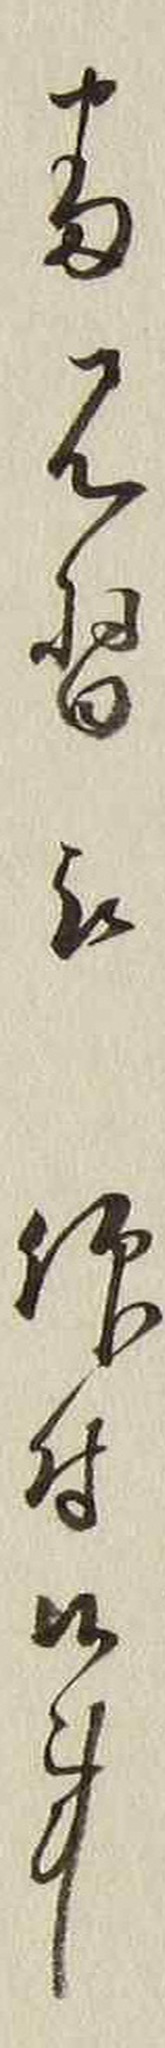番見習被仰付候事
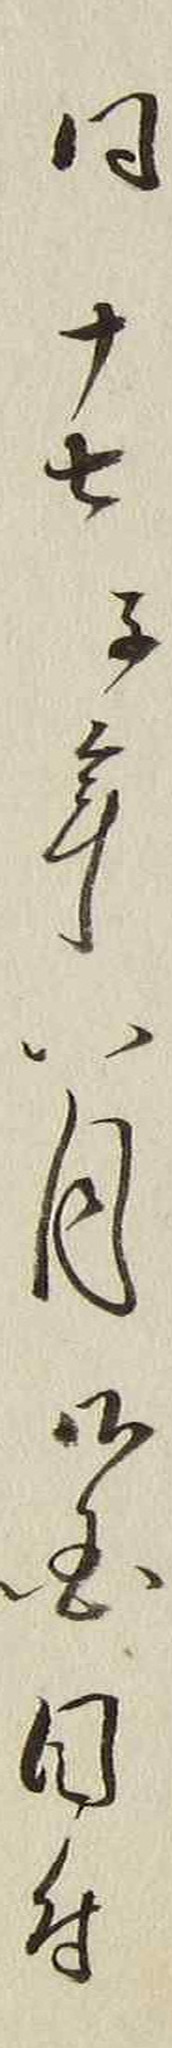一同十七子年八月御国目付
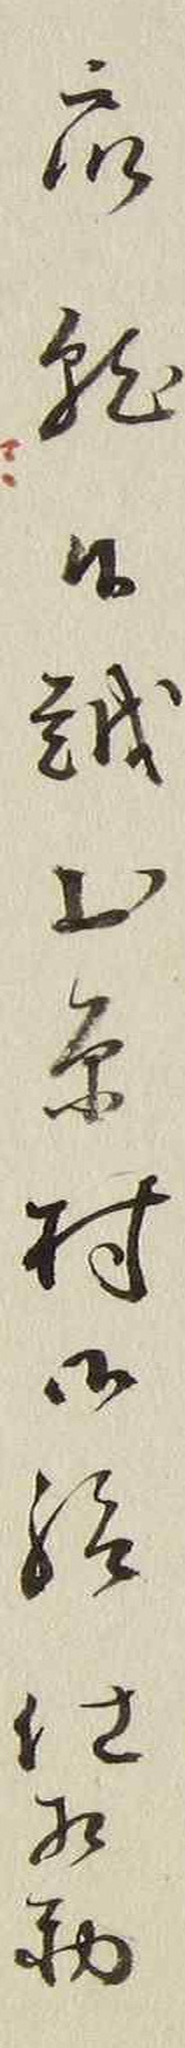衆就御越於原村御給仕相勤
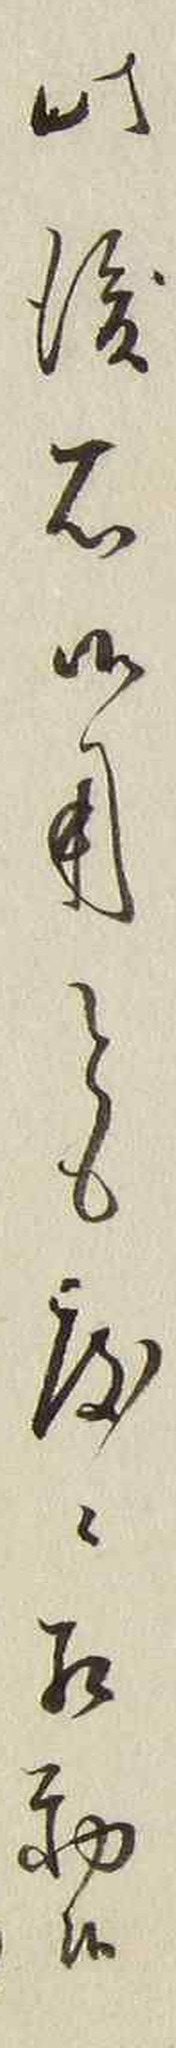此後右御用とも度々相勤候事

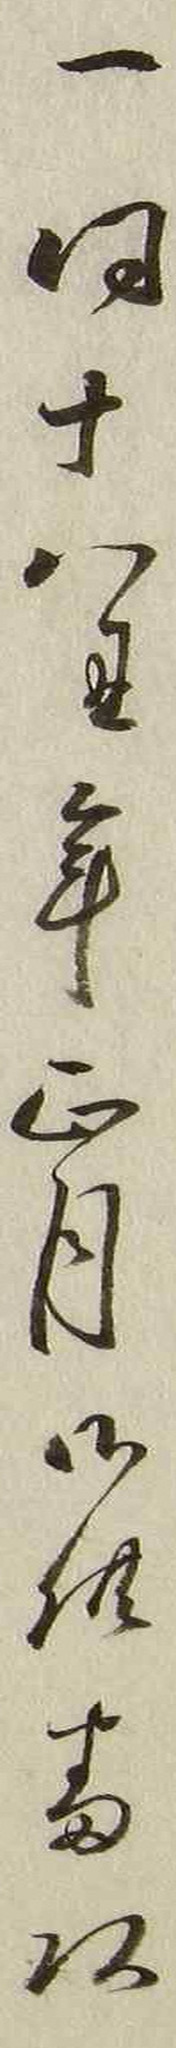一同十八丑年正月御供番頭
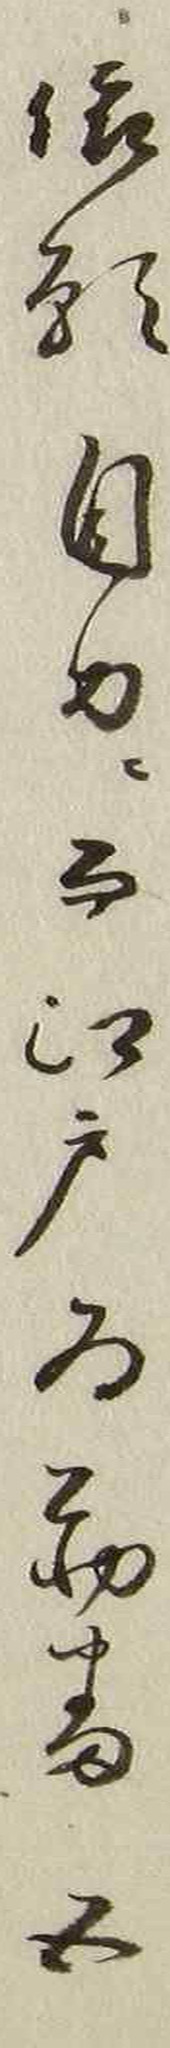依願自力に而江戸為勤番五
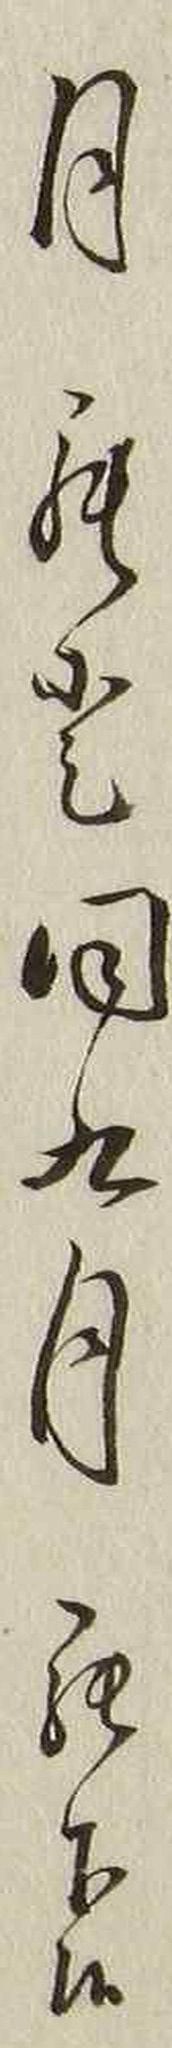月罷登同九月罷下候
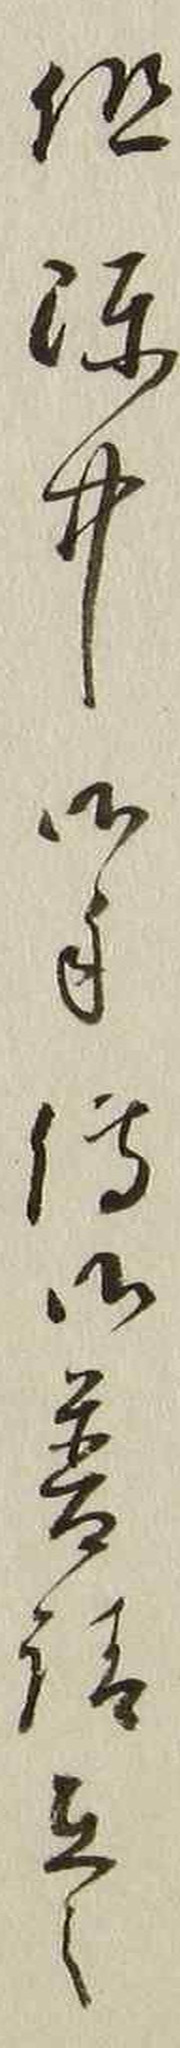但陣中御手伝御普請在之
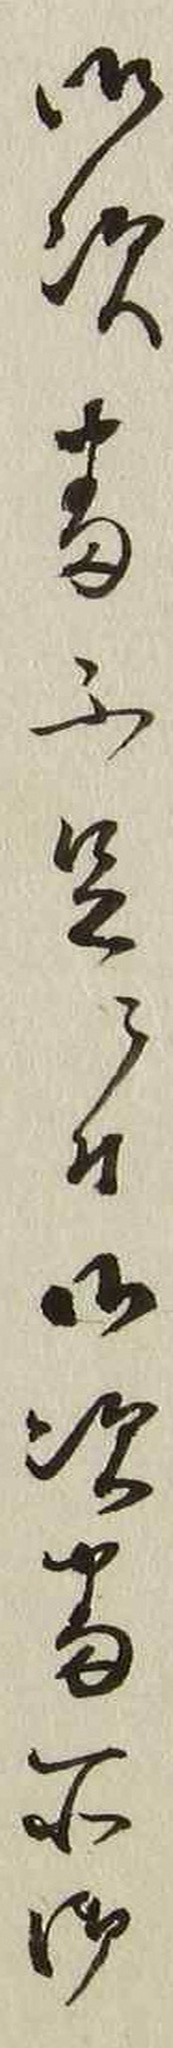御次番不足に付御次番所御
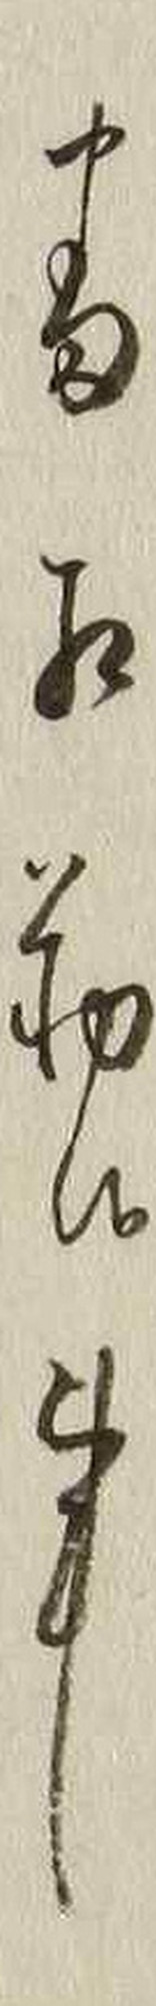番相勤候事
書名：諸士系譜　巻之159　な之部1
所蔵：会津若松市立会津図書館
